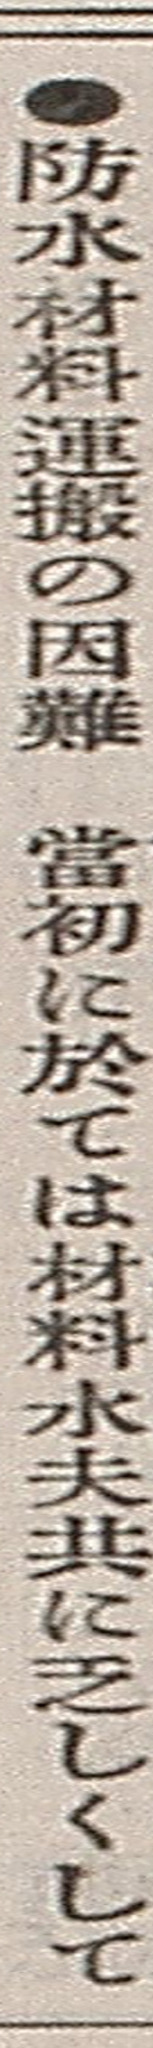●防水材料運搬の困難当初に於ては材料水夫共に乏しくして
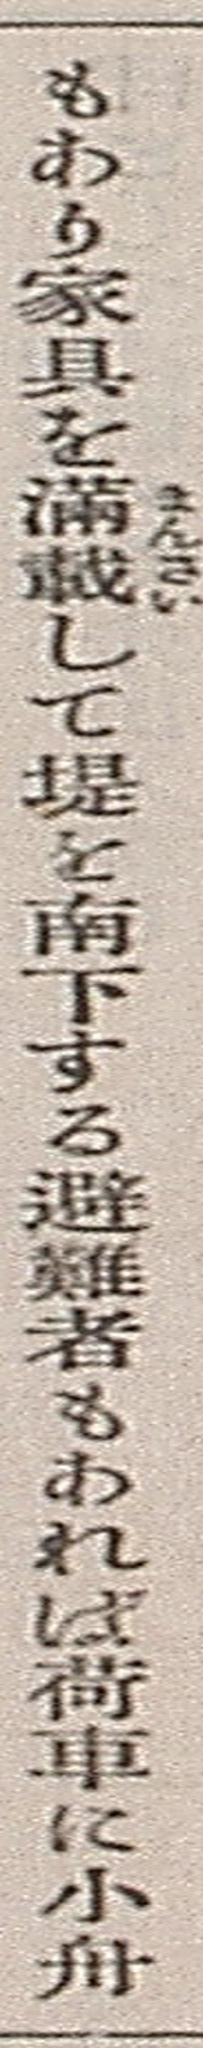もあり家具を満載して堤を南下する避難者もあれば荷車に小舟
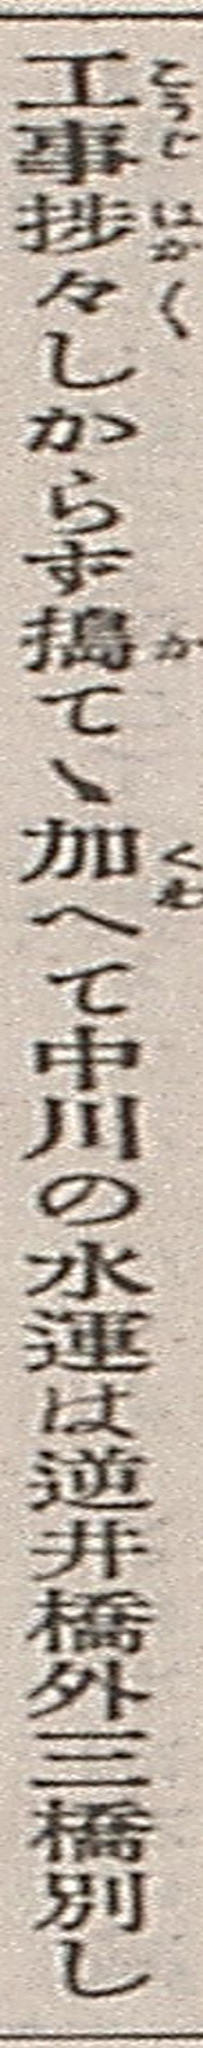工事捗々しからず搗てゝ加へて中川の水運は逆井橋外三橋別し
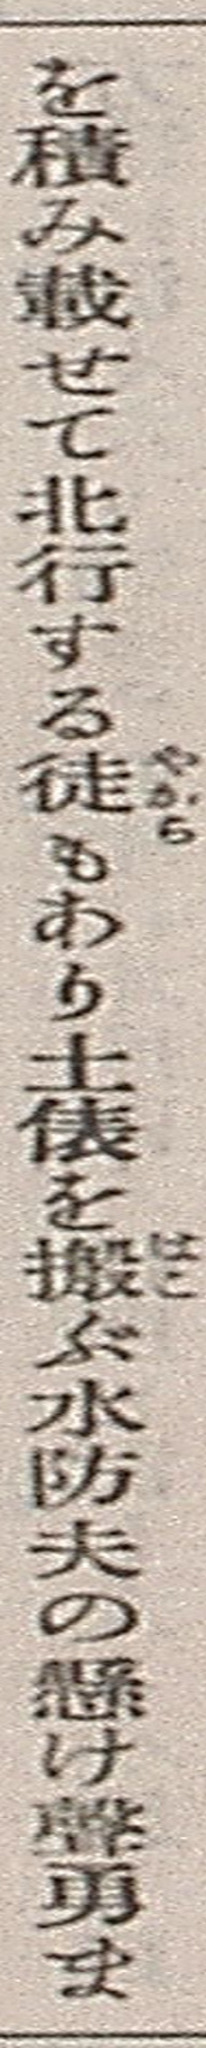を積み載せて北行する徒もあり土俵を搬ぶ水防夫の懸け声勇ま
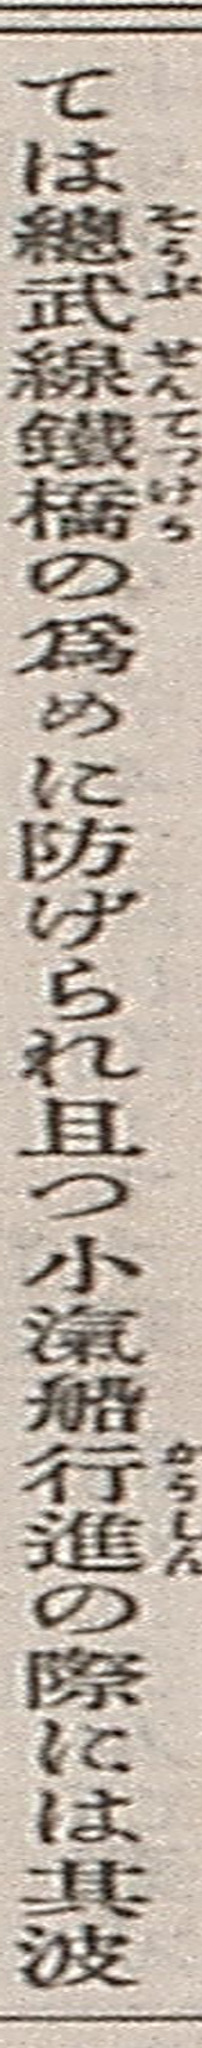ては総武線鉄橋の為めに防げられ且つ小汽船行進の際には其波
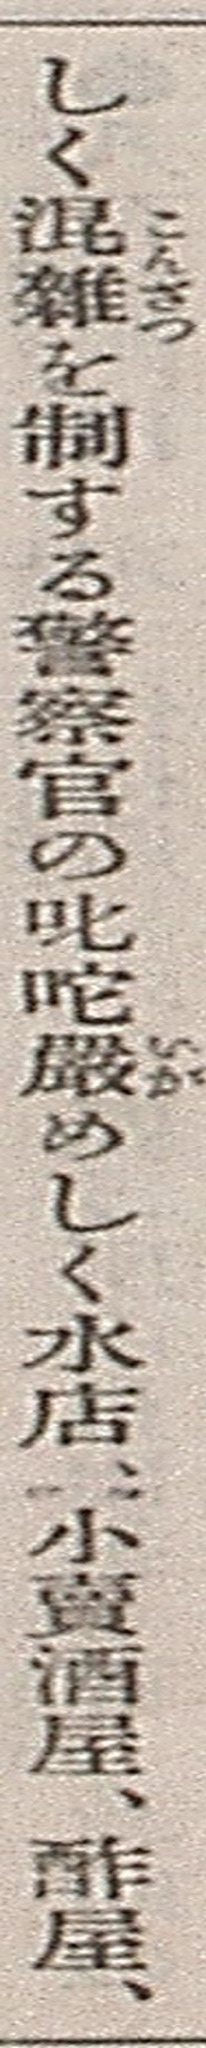しく混雑を制する警察官の叱咤巌めしく水店、小売酒屋、酢屋、
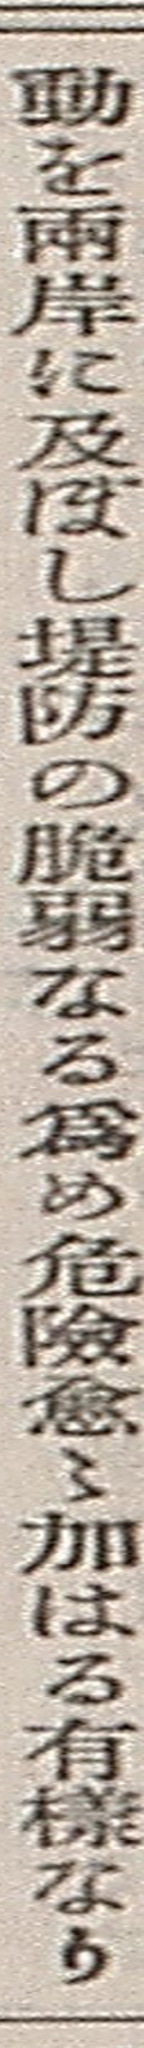動を両岸に及ぼし堤防の脆弱なる為め危険愈々加はる有様なり
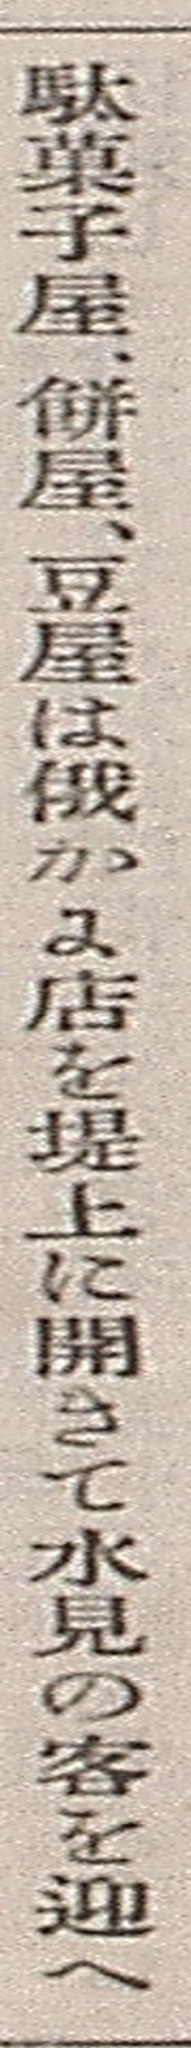駄菓子屋、餅屋、豆屋は俄かに店を堤上に開きて水見の客を迎へ
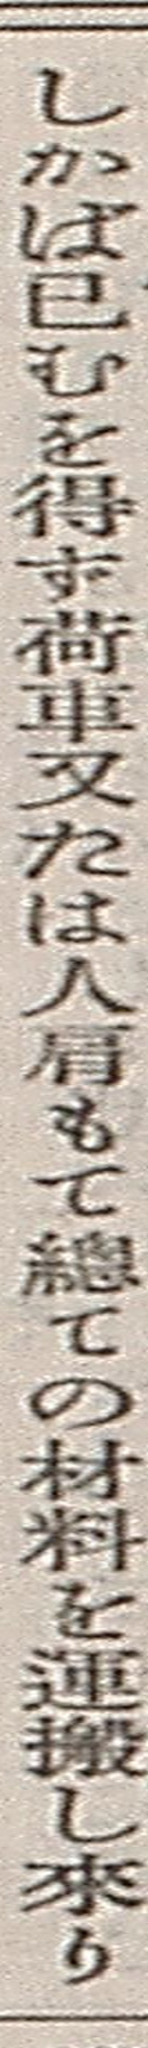しかば已むを得ず荷車又たは人肩もて総ての材料を運搬し来り
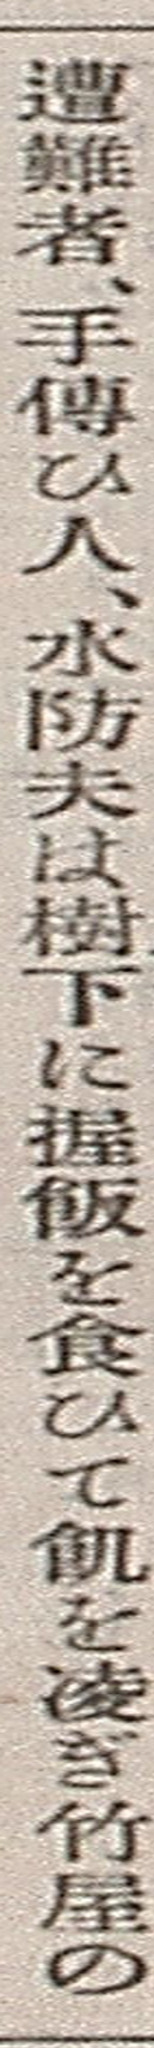遭難者、手伝ひ人、水防夫は樹下に握飯を食ひて飢を凌ぎ竹屋の
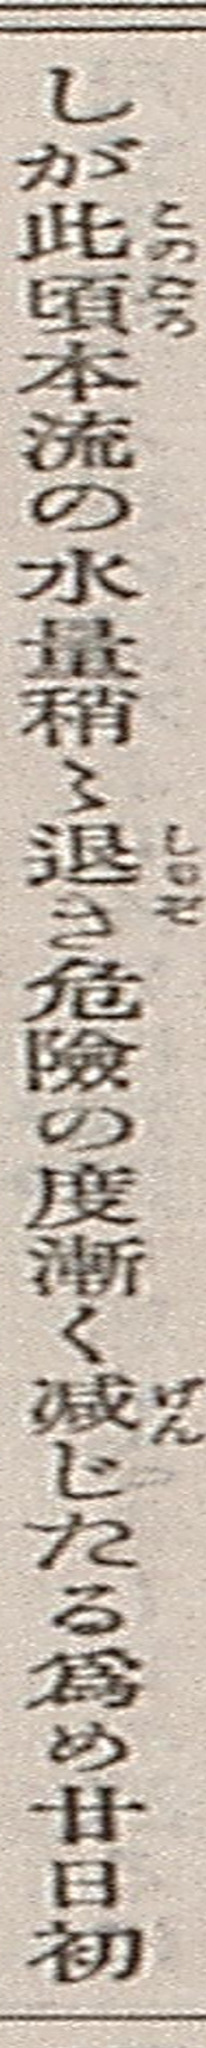しが此頃本流の水量稍々退き危険の度漸く減じたる為め廿日初
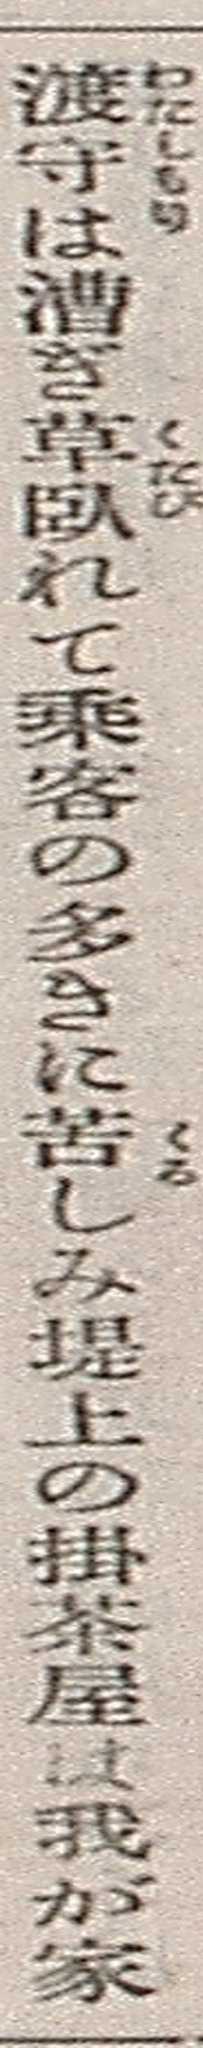渡守は漕ぎ草臥れて乗客の多きに苦しみ堤上の掛茶屋は我が家
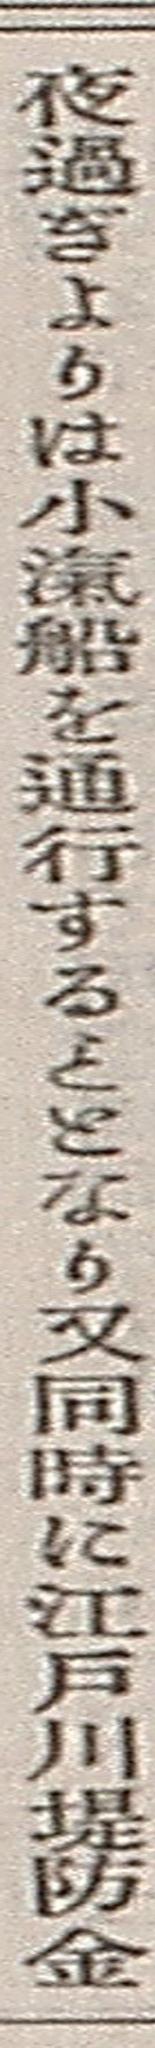夜過ぎよりは小汽船を通行することとなり又同時に江戸川堤防金
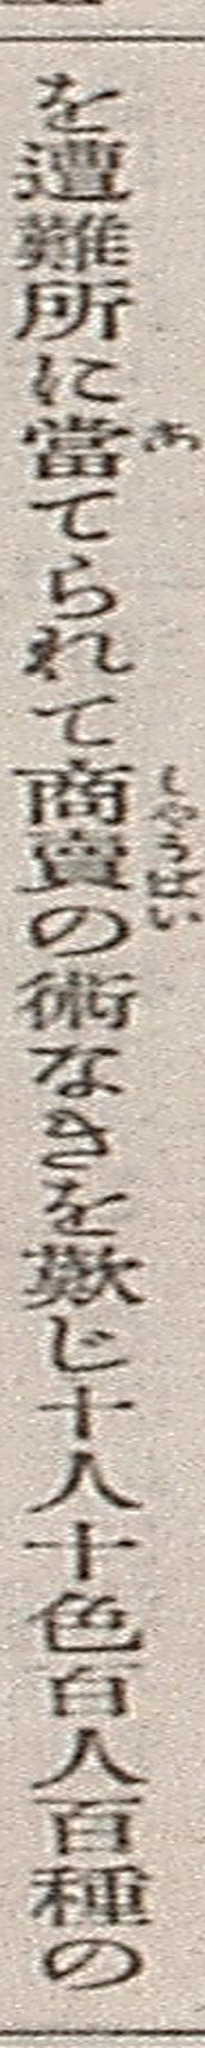を避難所に当てられて商売の術なきを歎じ十人十色百人百種の
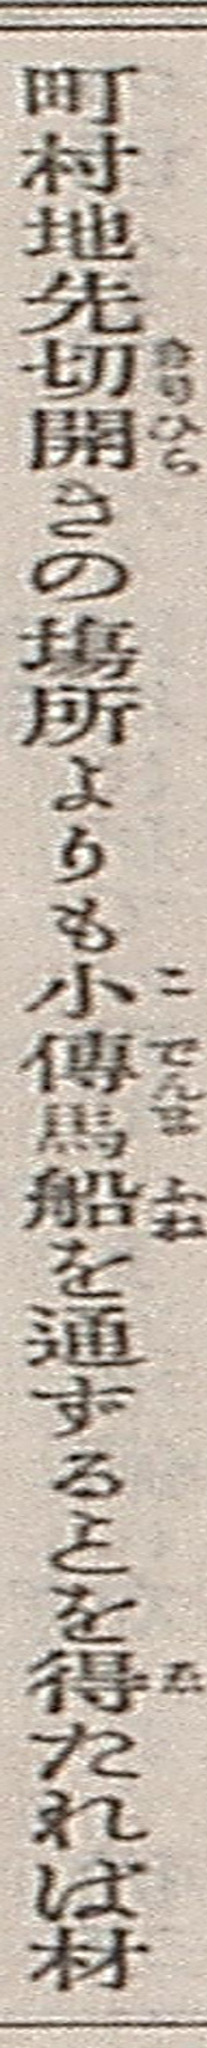町村地先切開きの場所よりも小伝馬船を通ずることを得たれば材
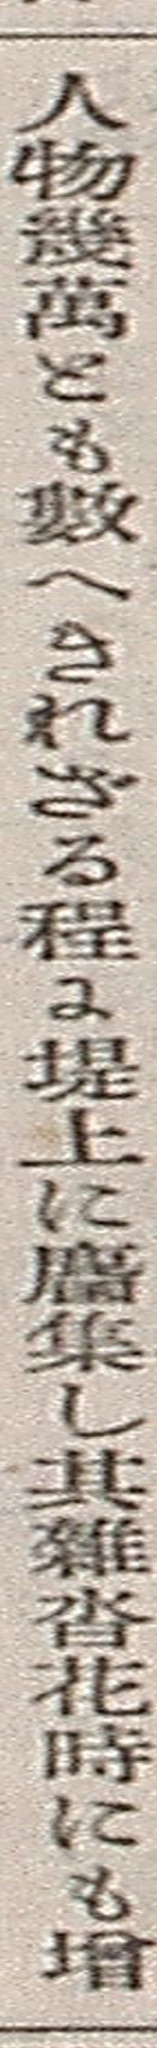人物幾万とも数へきれざる程に堤上に麕集し其雑沓花時にも増
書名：風俗畫報臨時増刊第百二十四號　洪水地震被害録（上）
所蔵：東京大学地震研究所図書室 Earthquake Research Institute Library, The University of Tokyo, JAPAN
